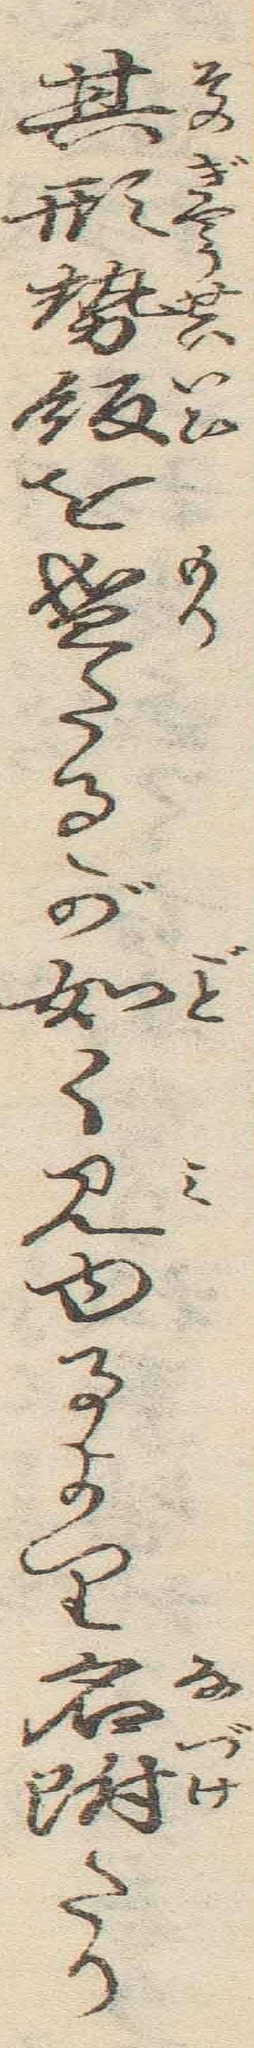其形㔟飯を盛たるが如く見ゆるより名附たり
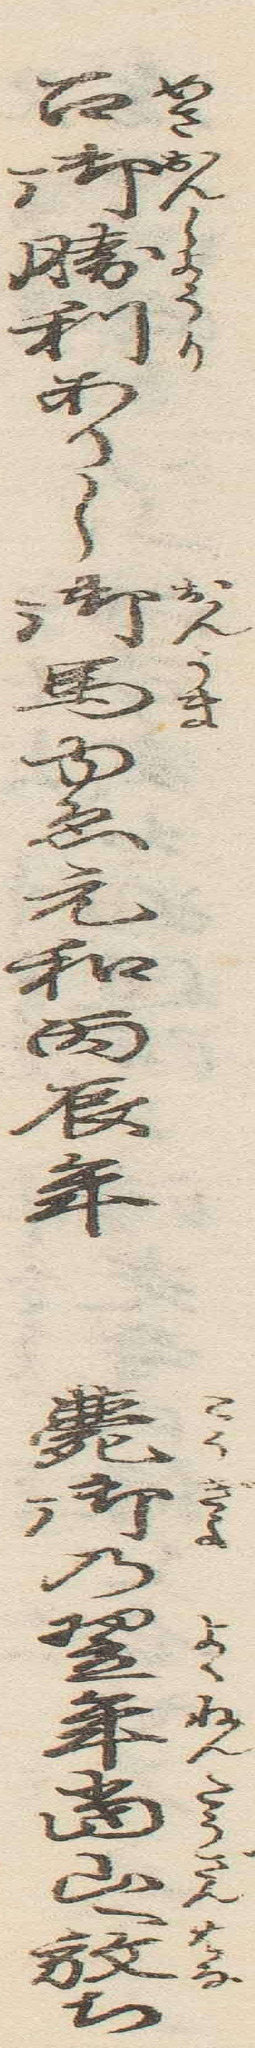召御勝利ありし御馬ゆゑ元和丙辰年薨御の翌年當山へ放ち
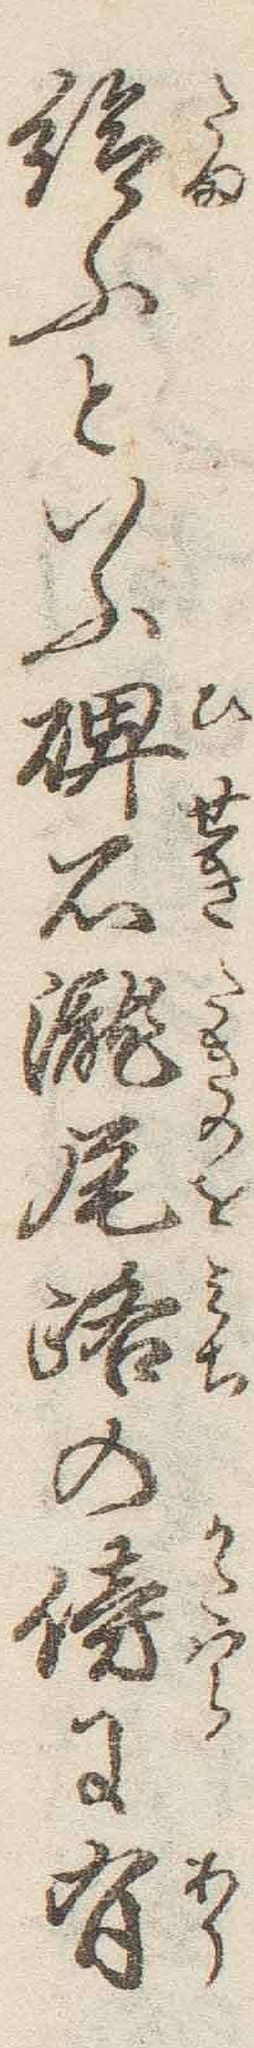給ふといふ碑石瀧尾路の傍に有
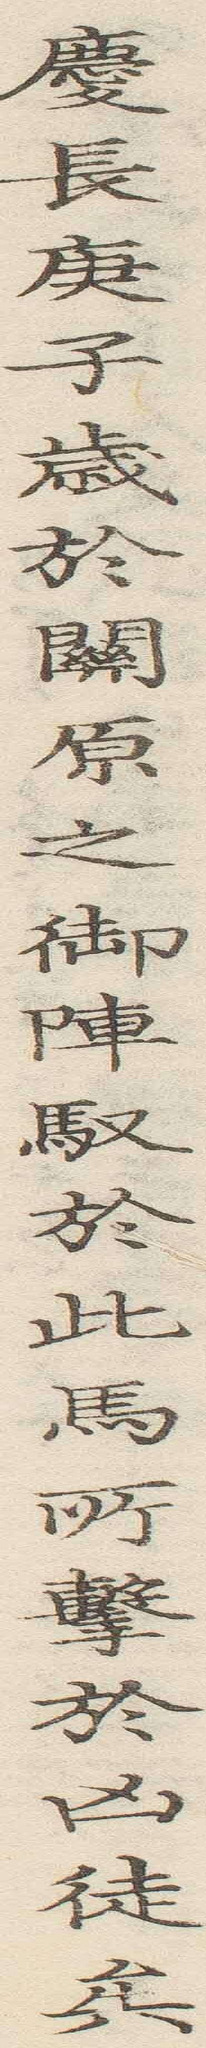慶長庚子歳御關原之御陣馭於此馬所擊於凶徒矣
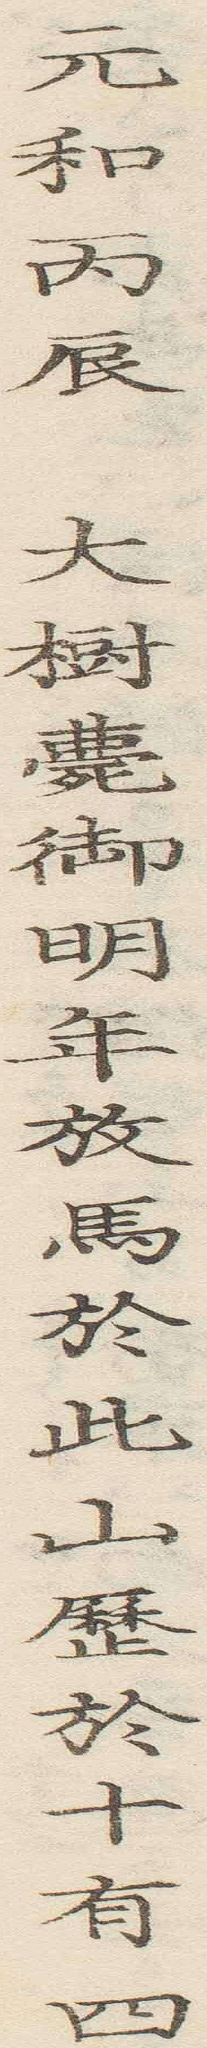元和丙𫝕大𣗳薨御明年放馬於此山歷於十有四
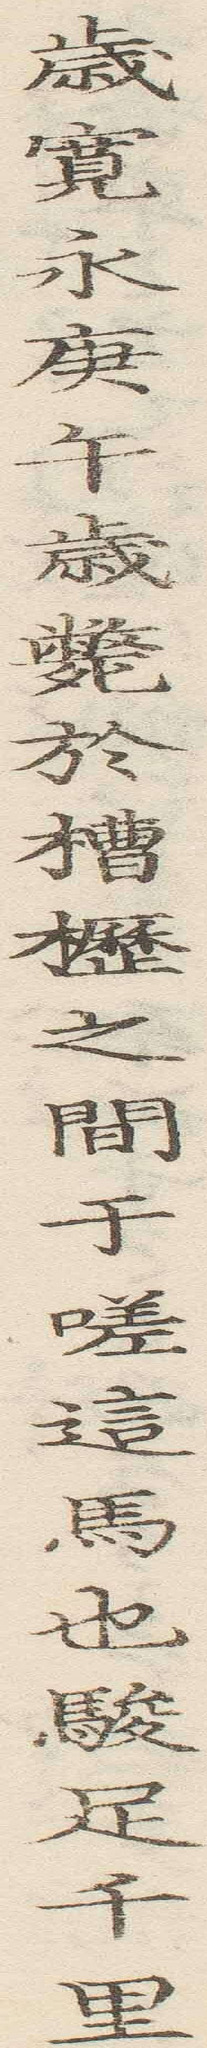歳寛永庚午歳斃於槽櫪之間于嗟這馬也駿足千里
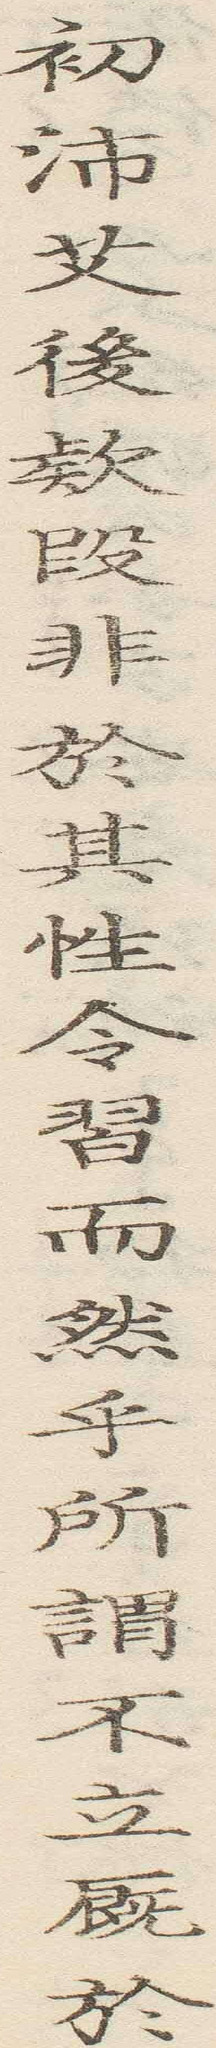初沛艾後欵段非於其性令習而然乎所謂不立厩於
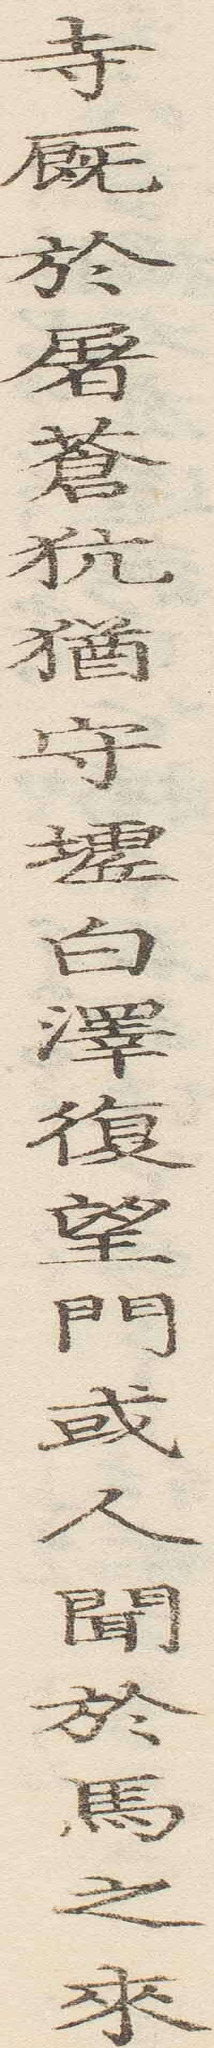寺厩於屠蒼犺猶守墟白澤復望門或人聞於馬之來
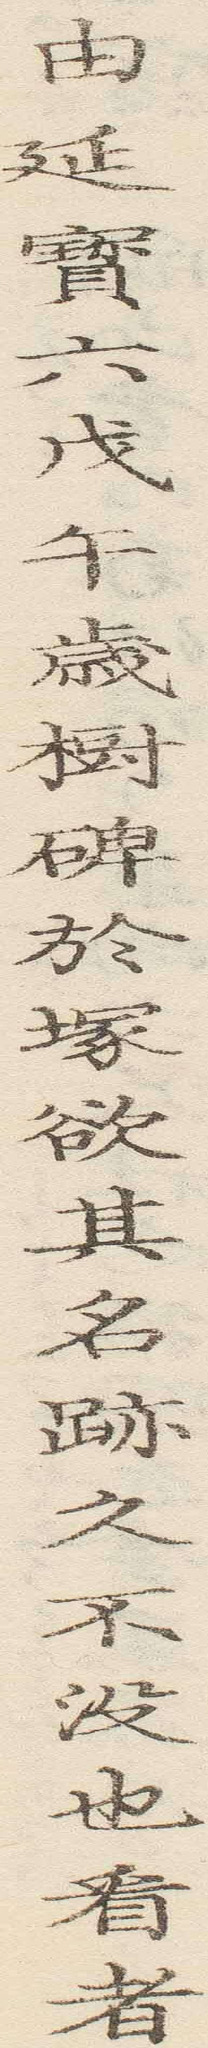由延寶六戊午歳𣗳碑於塚欲其名跡久不没也㸔者
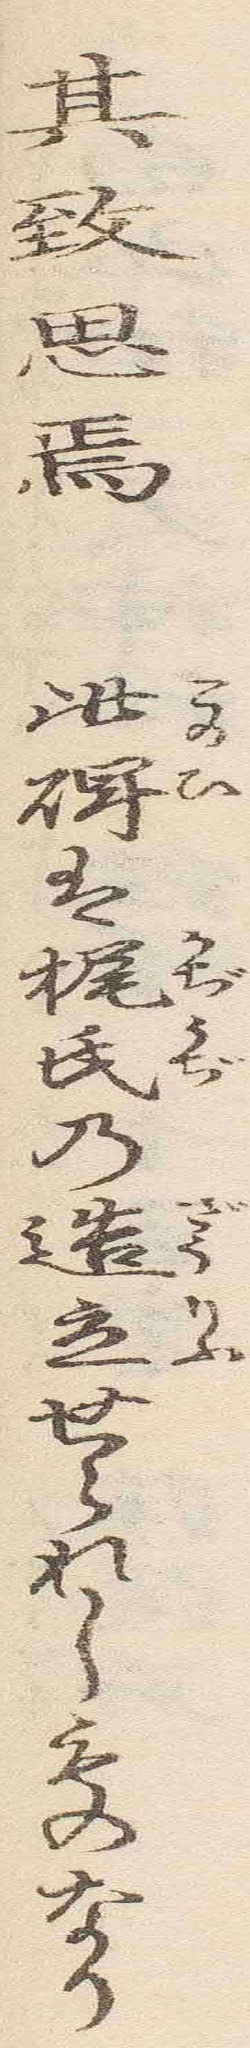其致思焉此碑は梶氏の造立せられしものなり
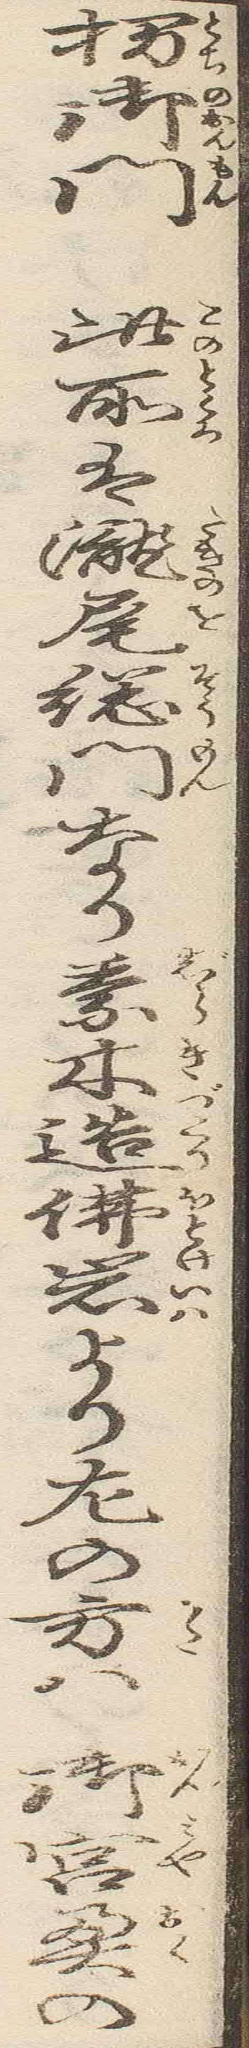栃御門此所は瀧尾総門なり素木造佛岩より㔫の方は御宮奥の
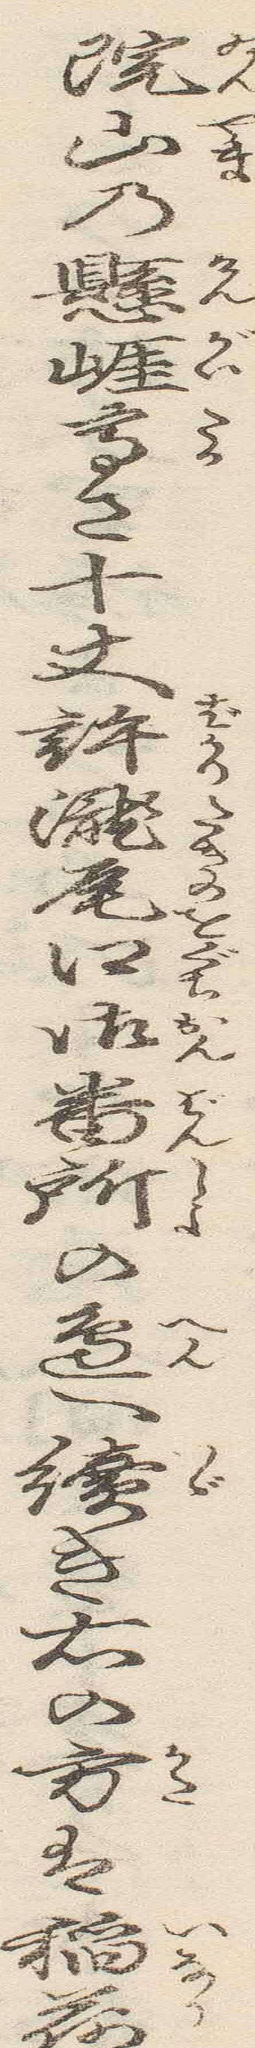院山の懸崕高さ十丈許瀧尾口御番所の邊へ續き右の方は稲荷
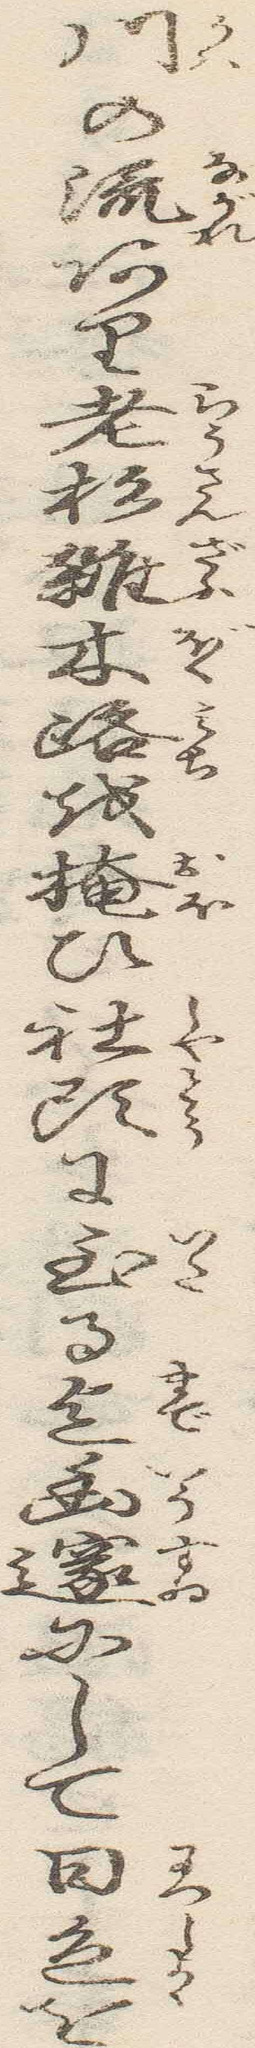川の流あり老杉雑木路を掩ひ社頭に至る迄幽邃にして日色を
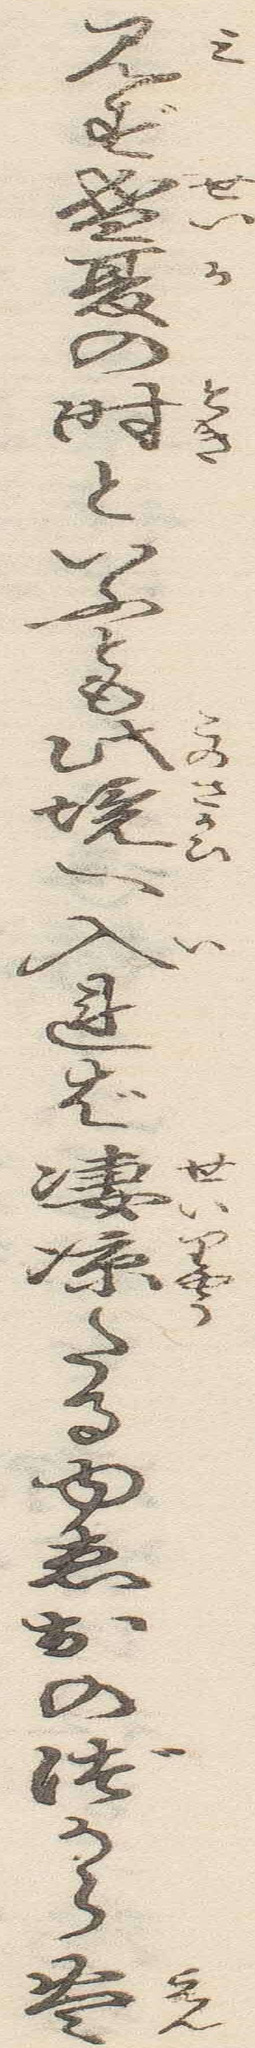見ず盛夏の时といふとも此境へ入れば凄凉たるゆゑおのづから炎
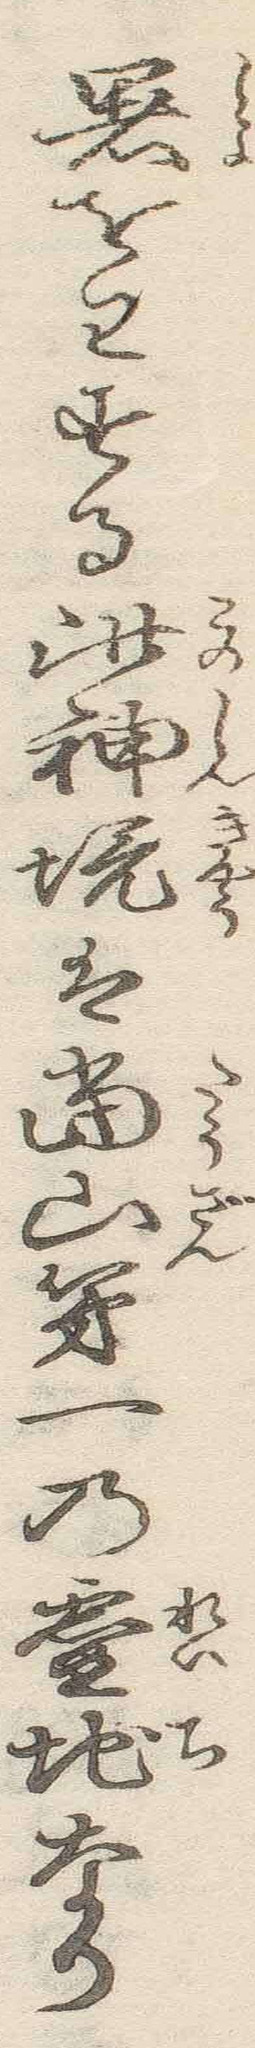暑をわする此神境は當山第一の靈地なり
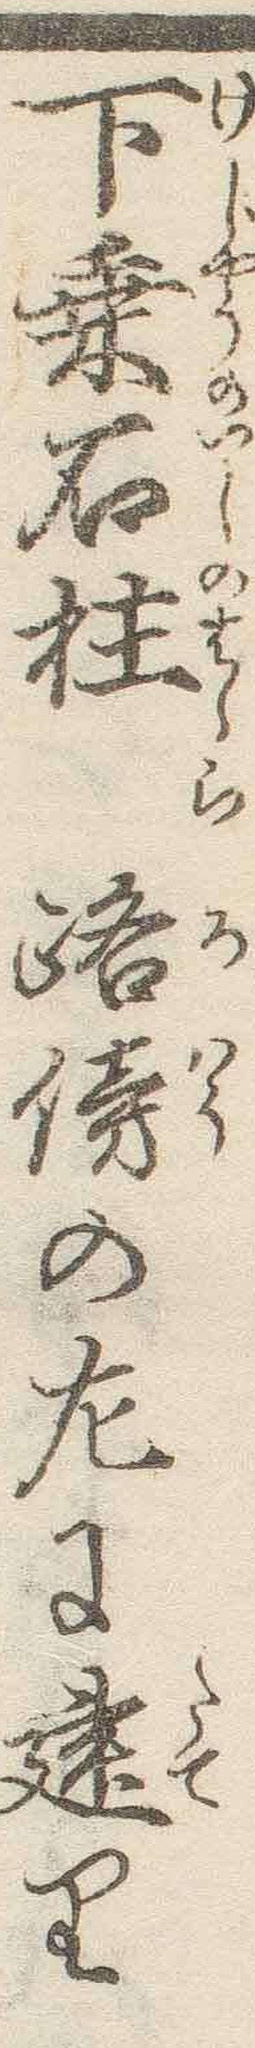下乗石柱路傍の㔫に建り
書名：日光山志
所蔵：東京学芸大学附属図書館 国文学研究資料館
